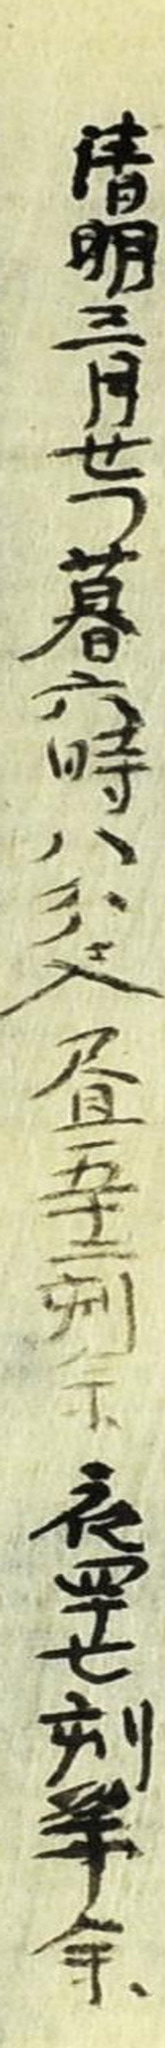清明三月せつ暮六時八分ニ入昼五十二刻余夜四十七刻半余
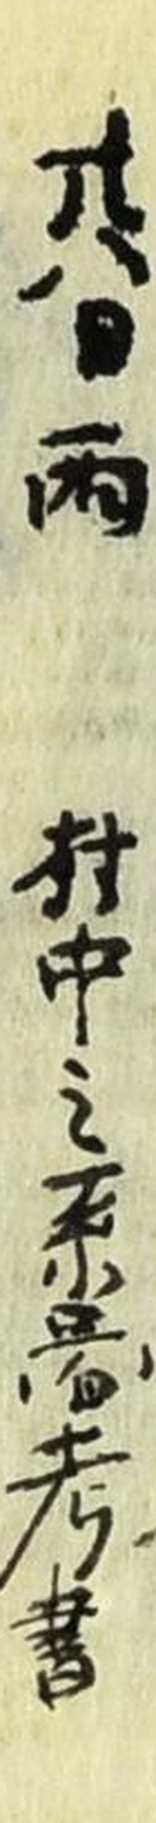廿八日雨村中之系図考書
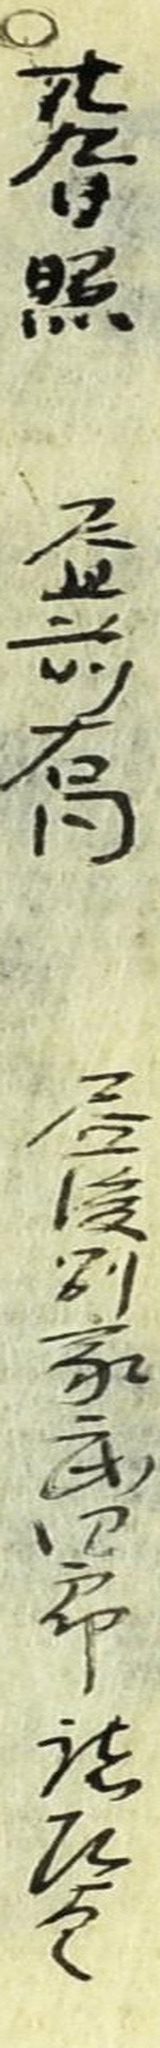○廿九日照昼前右同昼後別家武四郎諸道具
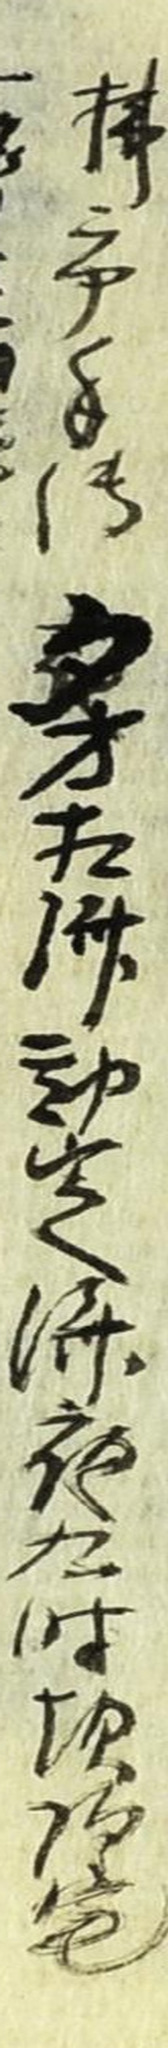払市手伝夕方相済勘定済夜九時頃帰宅
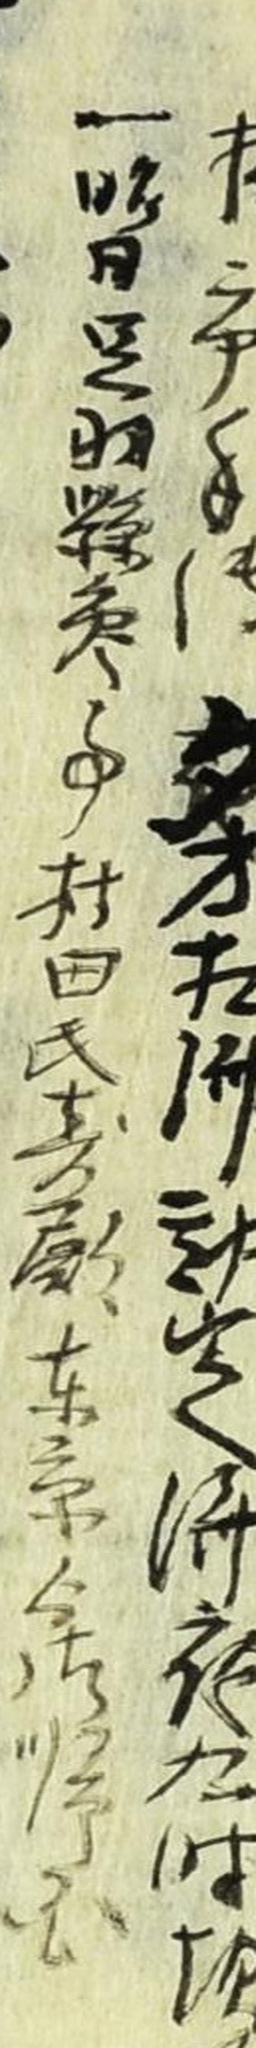一昨日足羽県参事村田氏寿殿東京ゟ御帰国
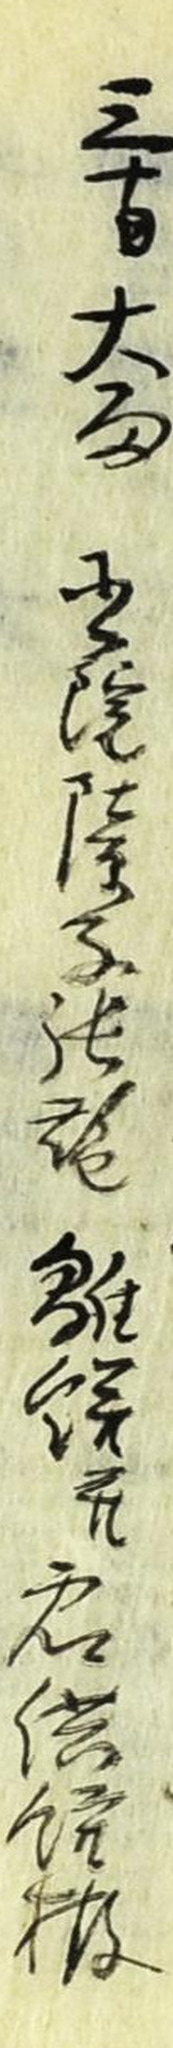三十日大雨書院障子張替雛餅并客供餅拵

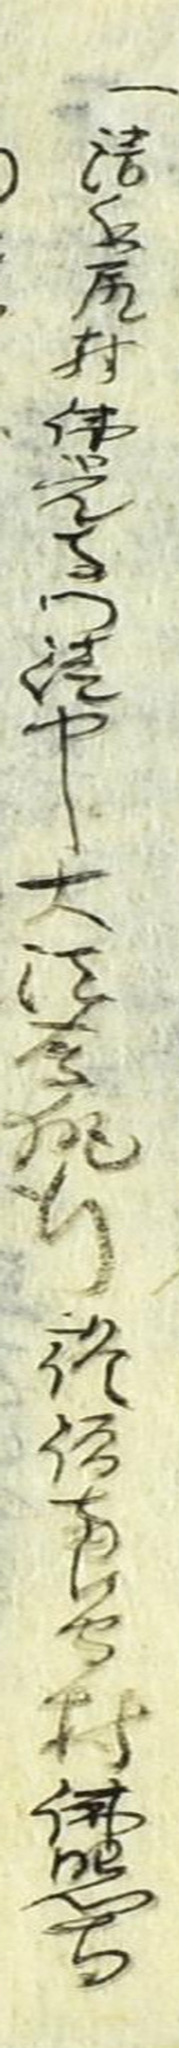一清水尻村仏覚寺門徒中大法会執行修僧南江守村仏照寺
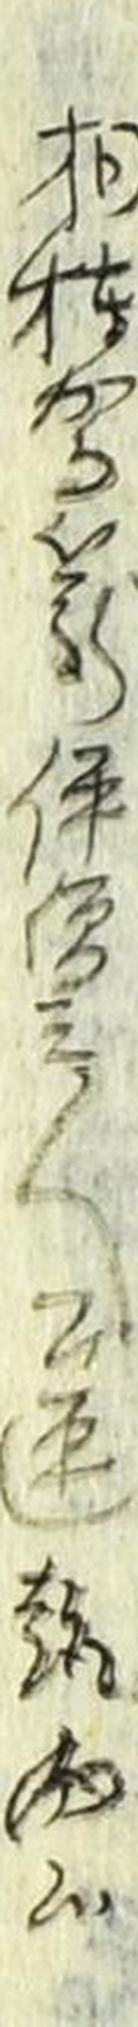相棒駕籠伴僧三人召連趣候
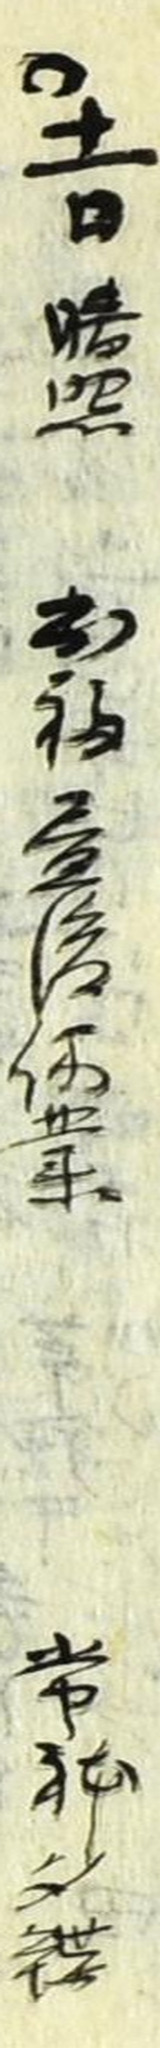○十一日晴照出福昼後休業常体夕鰈
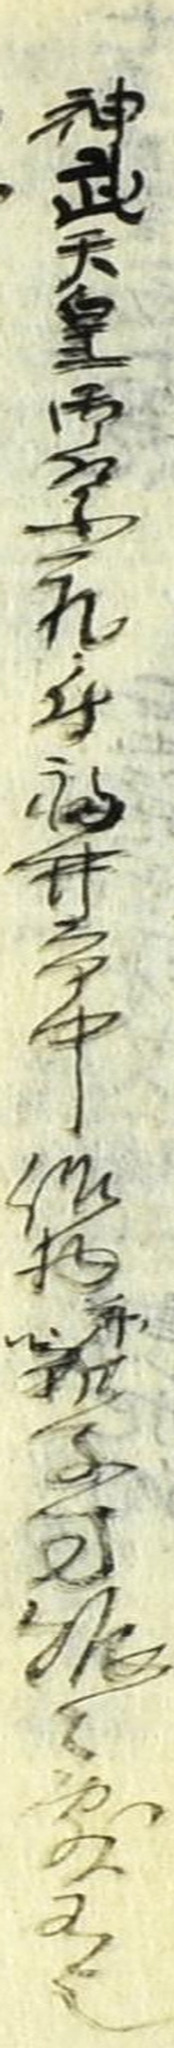神武天皇御祭礼ニ付福井市中作物幷囃子方賑々敷有之
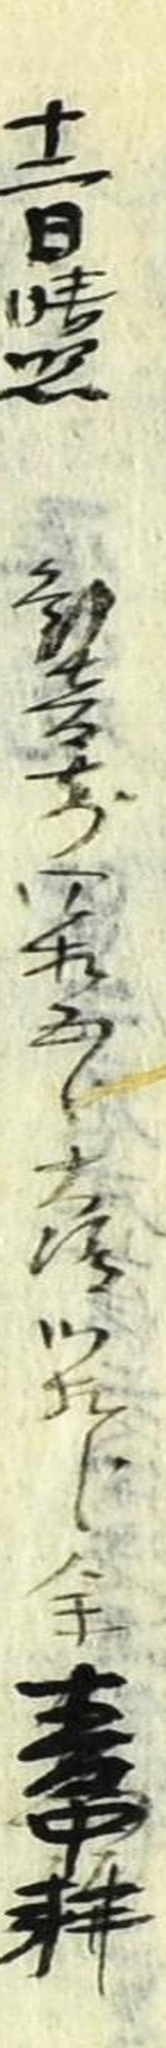十二日晴照勧音前田拾五歩大島弐拾歩余麦中耕
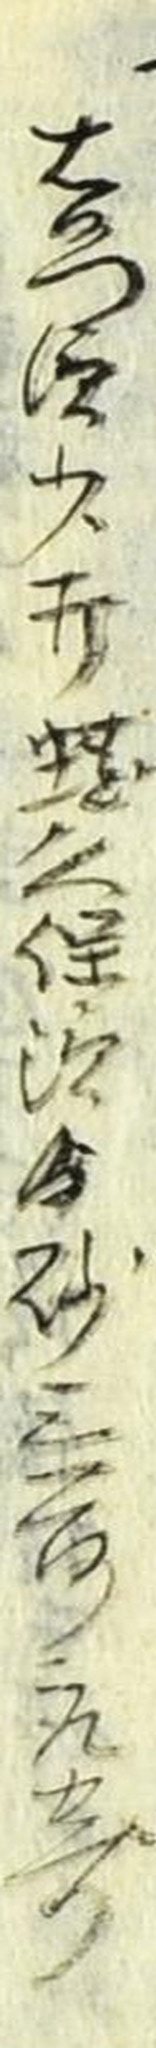忠右衛門浜少打蛙久保浜ゟ砂三荷取寄
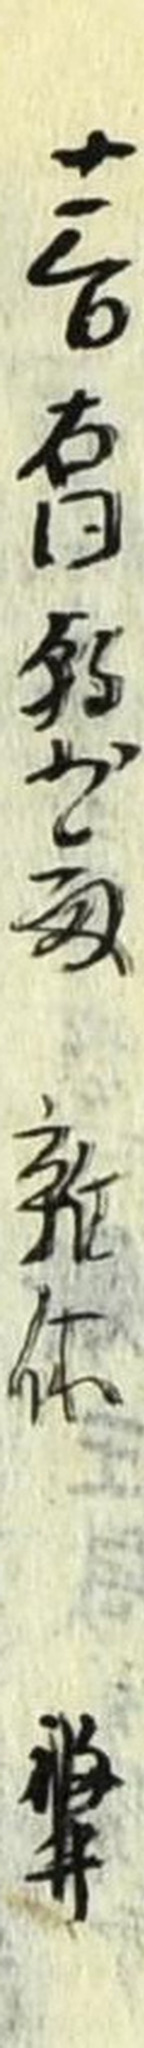十三日右同朝少々雨雑休福井
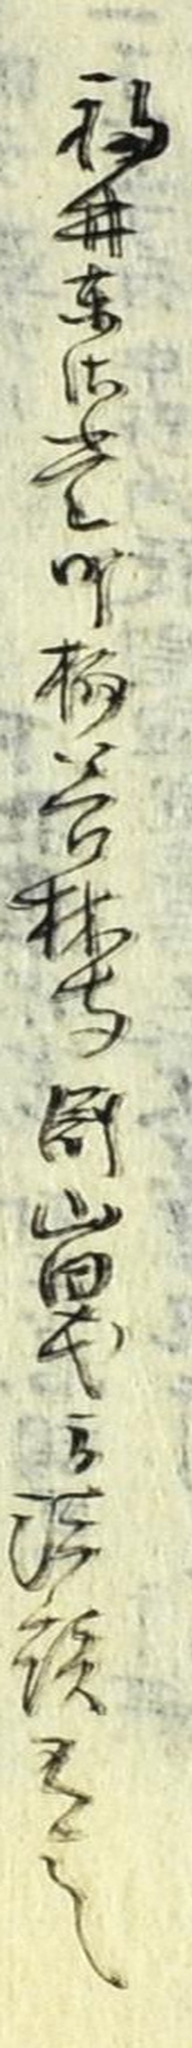福井東御堂町栢善林寺淵山田氏ニ而法談有之
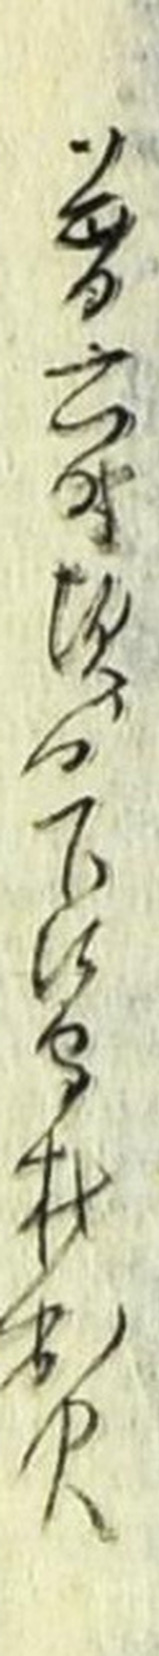暮六時頃ゟ下江守村出火
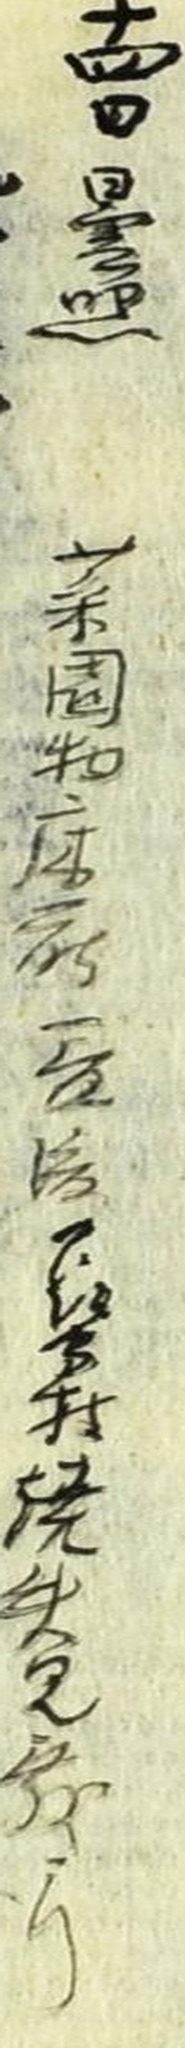十四日曇照菜園物床蒔昼後下江守村焼失見舞行
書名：（日記）
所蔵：福井県文書館 Fukui Prefectural Archives
